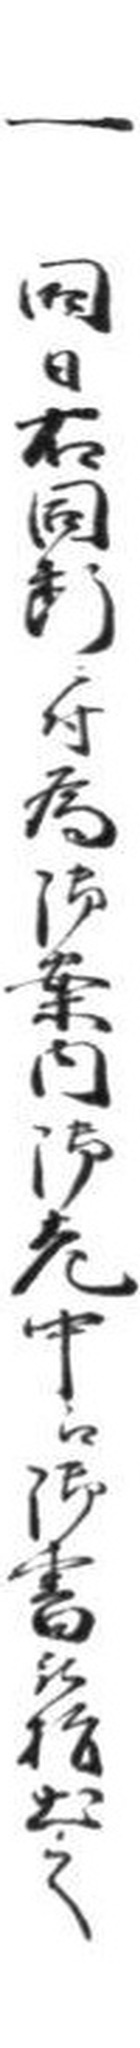一同日右同断ニ付為御案内御老中江御書被指出之
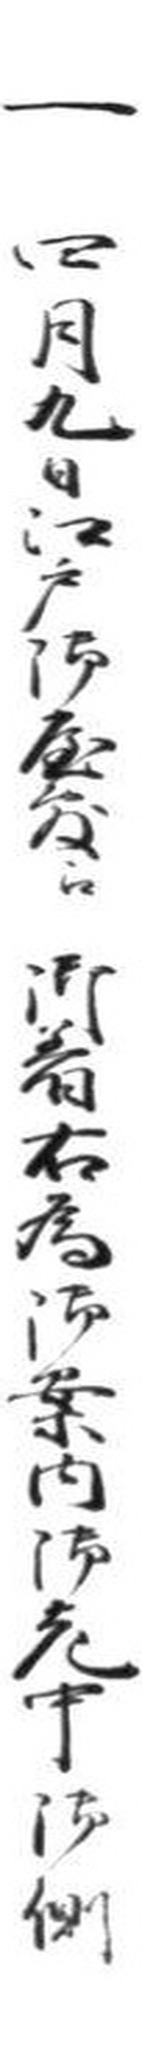一四月九日江戸御屋敷江御着右為御案内御老中御側
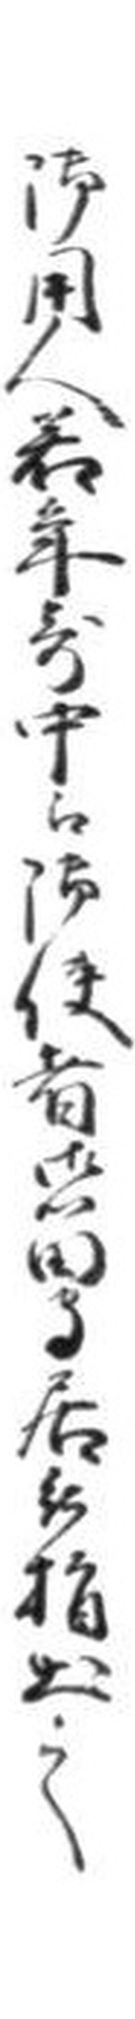御用人若年寄中江御使者御留守居被指出之
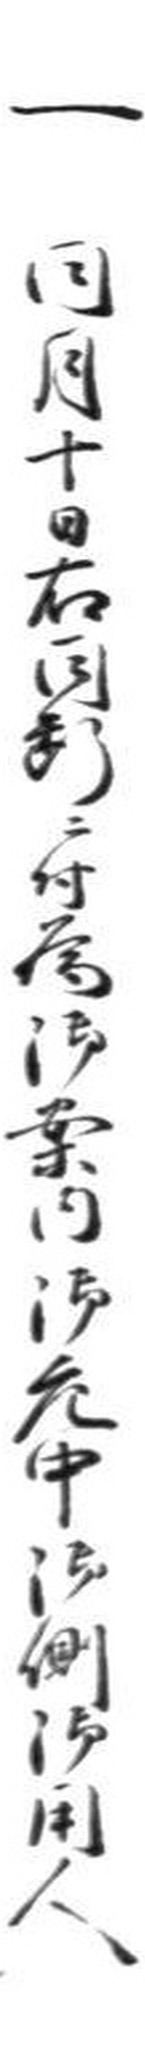一同月十日右同断ニ付為御案内御老中御側御用人
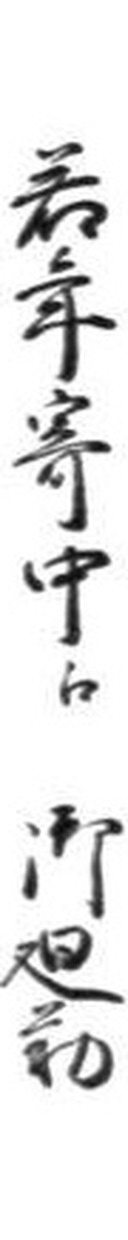若年寄中江御廻勤
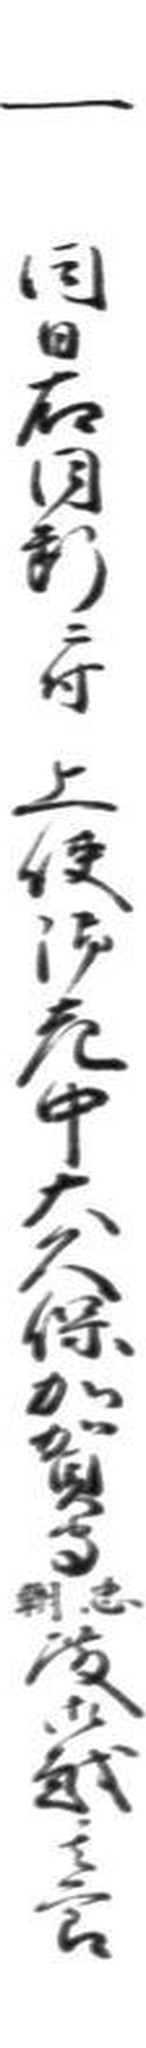一同日右同断ニ付上使御老中大久保加賀守忠朝殿御越其節
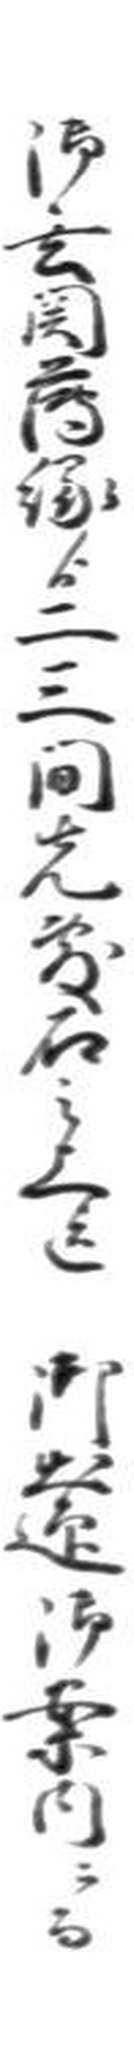御玄関薄縁ゟ二三間先敷石之上迄御出迎御案内ニ而
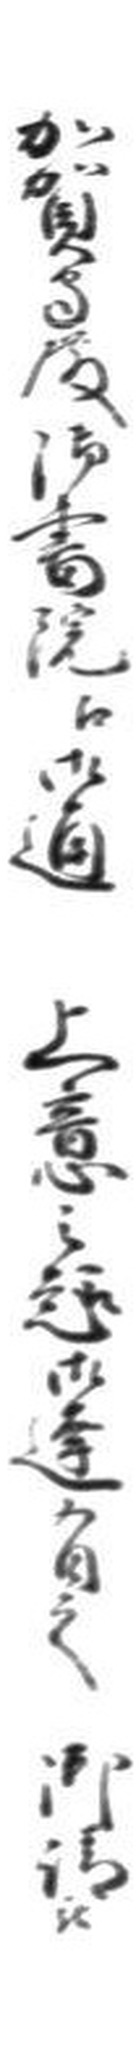加賀守殿御書院江御通上意之趣御達有之御請被
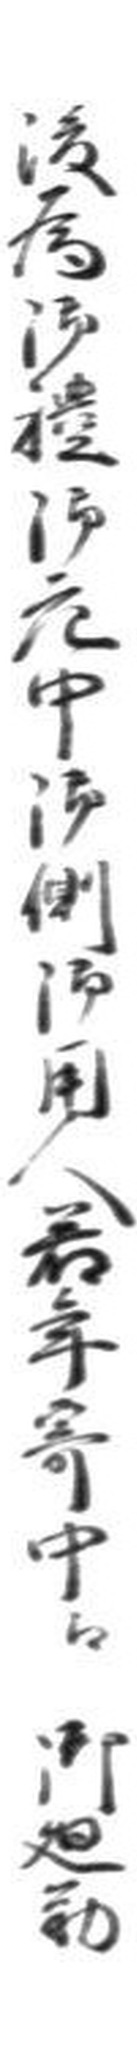後為御礼御老中御側御用人若年寄中江御廻勤
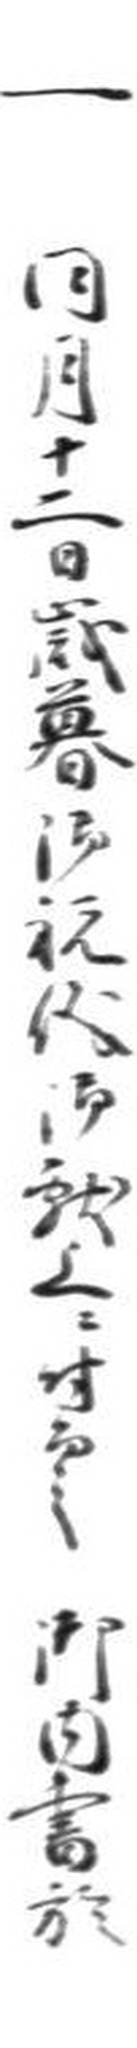一同月十二日歳暮御祝儀御献上ニ付而之御内書於
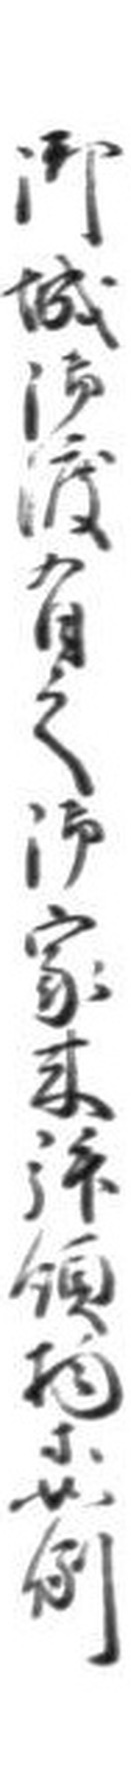御城御渡有之御家来拝領物等如例

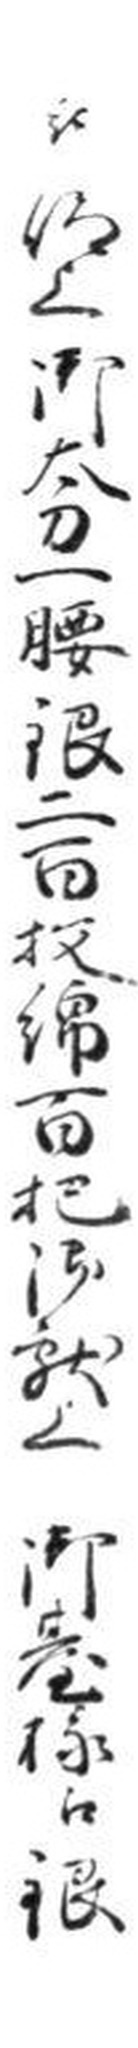被仰上御太刀一腰銀二百枚綿百把御献上御台様江銀
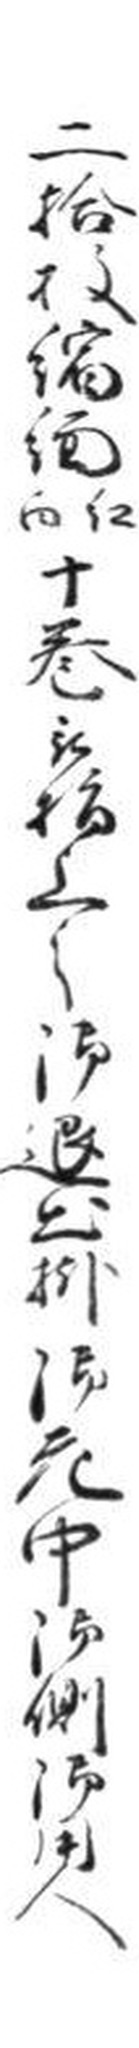二拾枚縮緬紅白十巻被指上之御退出掛御老中御側御用人
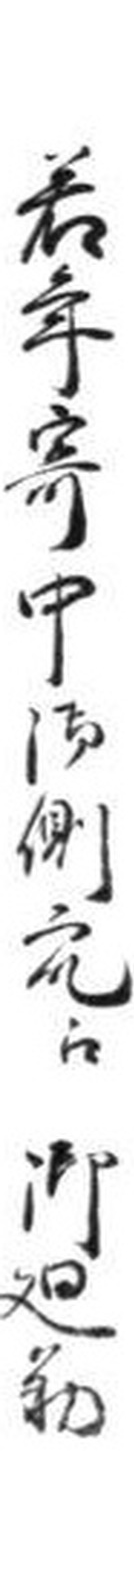若年寄中御側衆江御廻勤
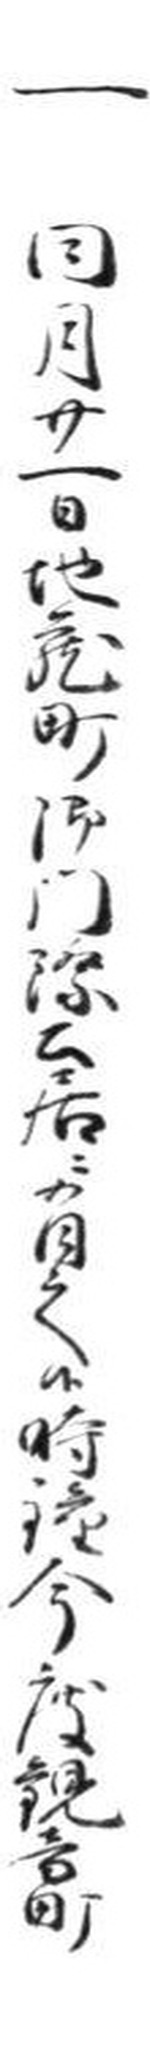一同月廿一日地蔵町御門際土居ニ有之候時鐘今度観音町
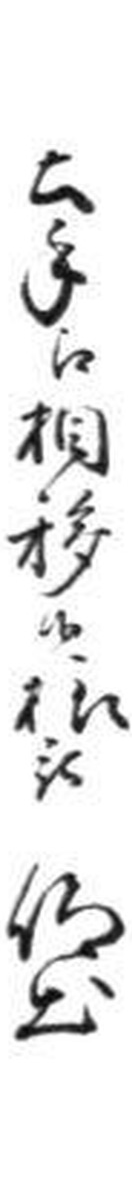土手江相移候様被仰出
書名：家譜 十七 吉品公 従元禄元年到同二年
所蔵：福井県文書館 Fukui Prefectural Archives
